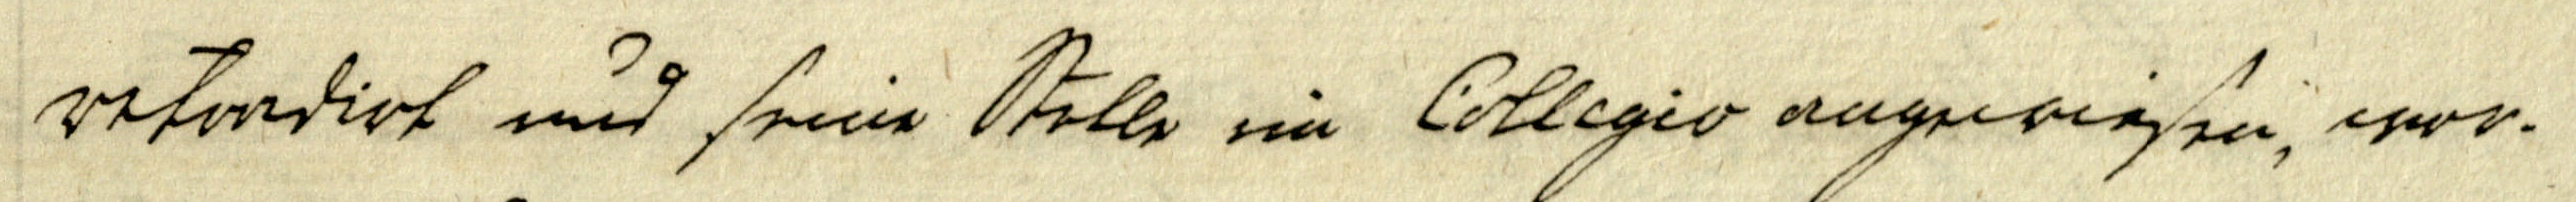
retradirt und seine Stelle im Collegio angewiesen wor¬
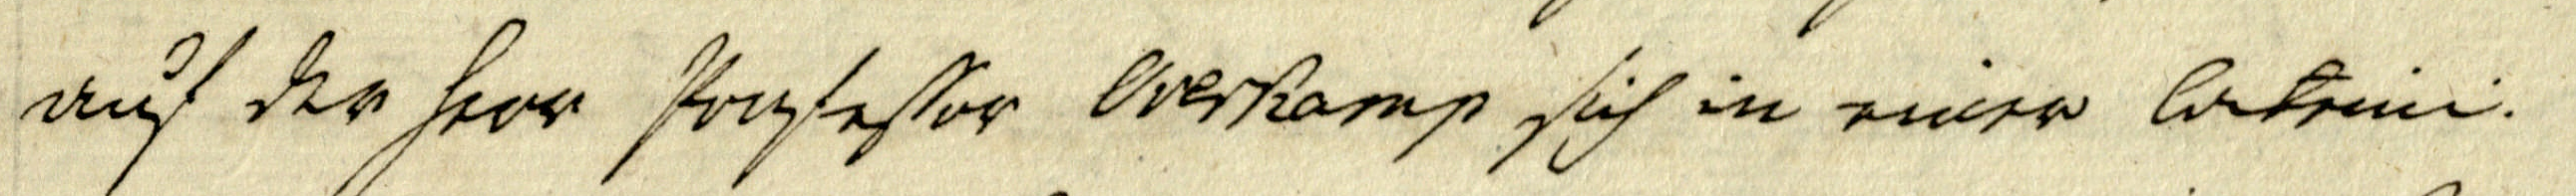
rauf der herr Professor Overkamp sich in einer lateini¬
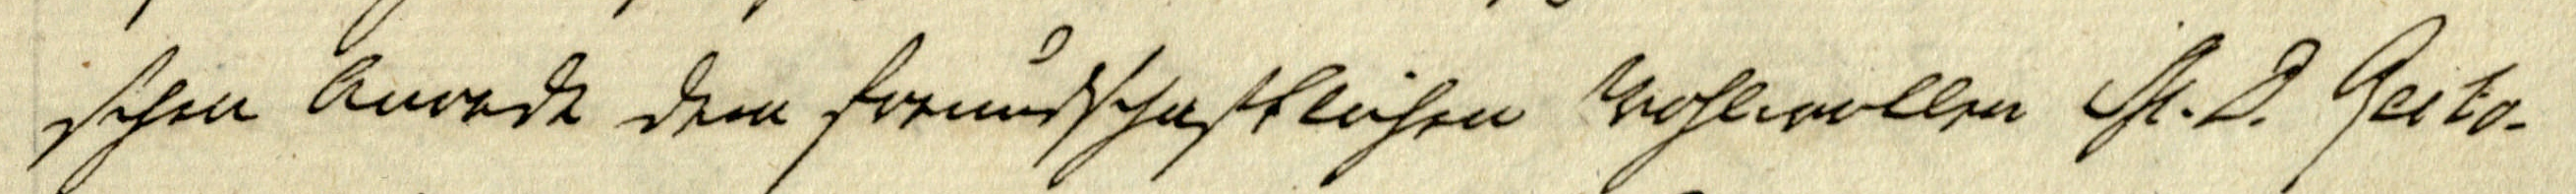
schen Anrede dem freundschaftlichen Wohlwollen M. D. Recto¬
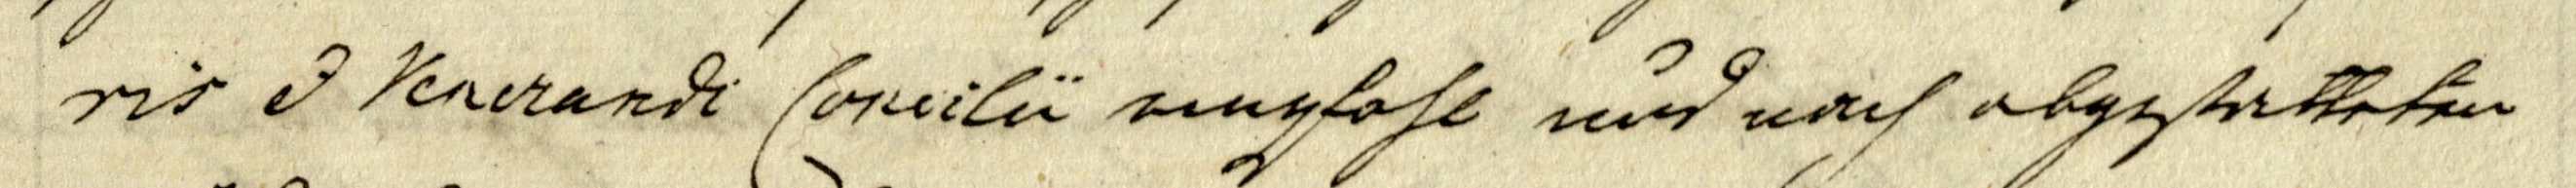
ris et Venerandi Concilii empfahl und nach abgestatteten
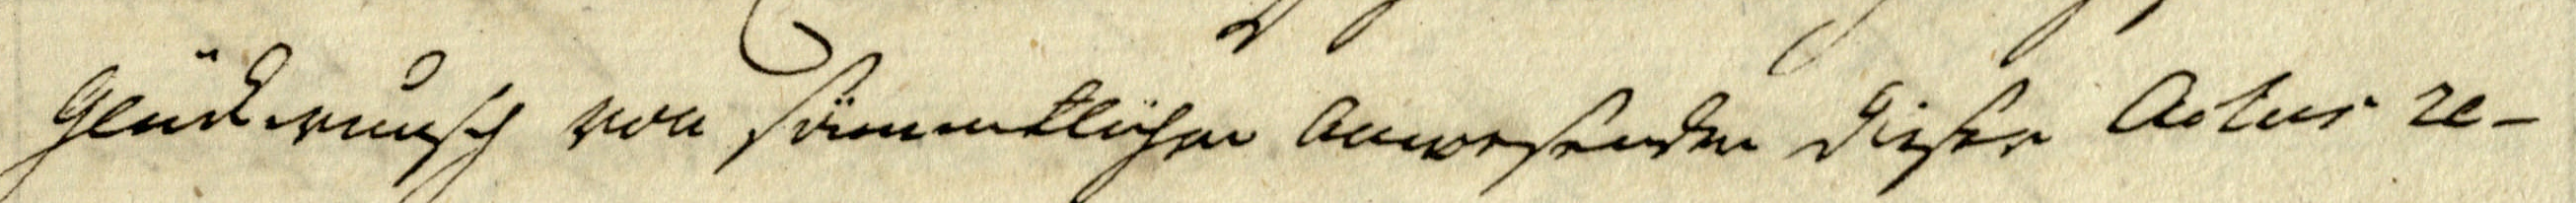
Glückwunsch von sämmtlichen Anwesenden dieser Actus re¬
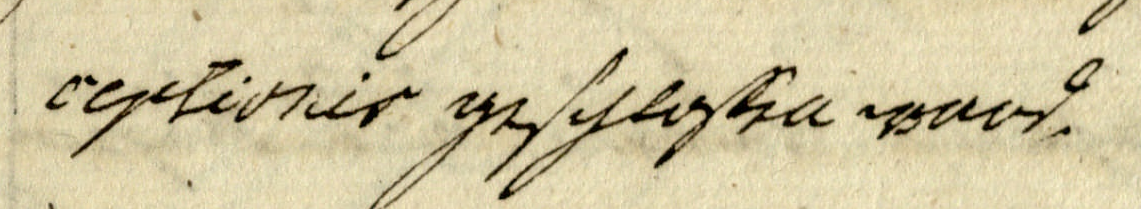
ceptionis geschlossen ward.
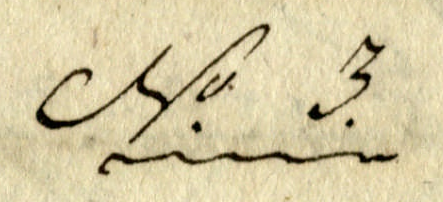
Nº 3.
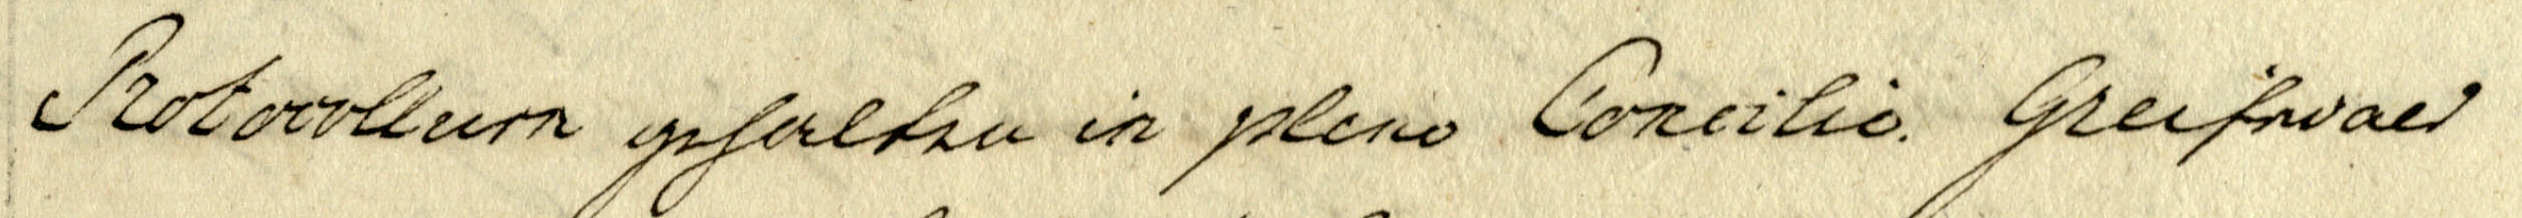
Protocollum gehalten in pleno Concilio Greifswald
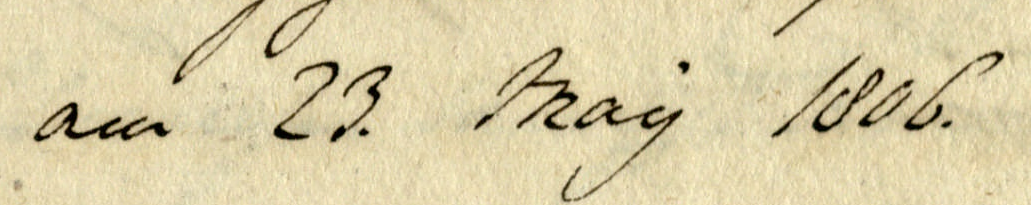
am 23. Maÿ 1806.
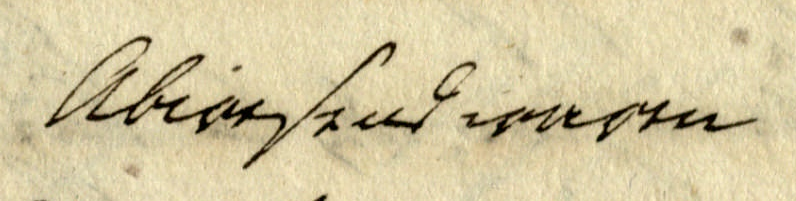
Abwesend waren
